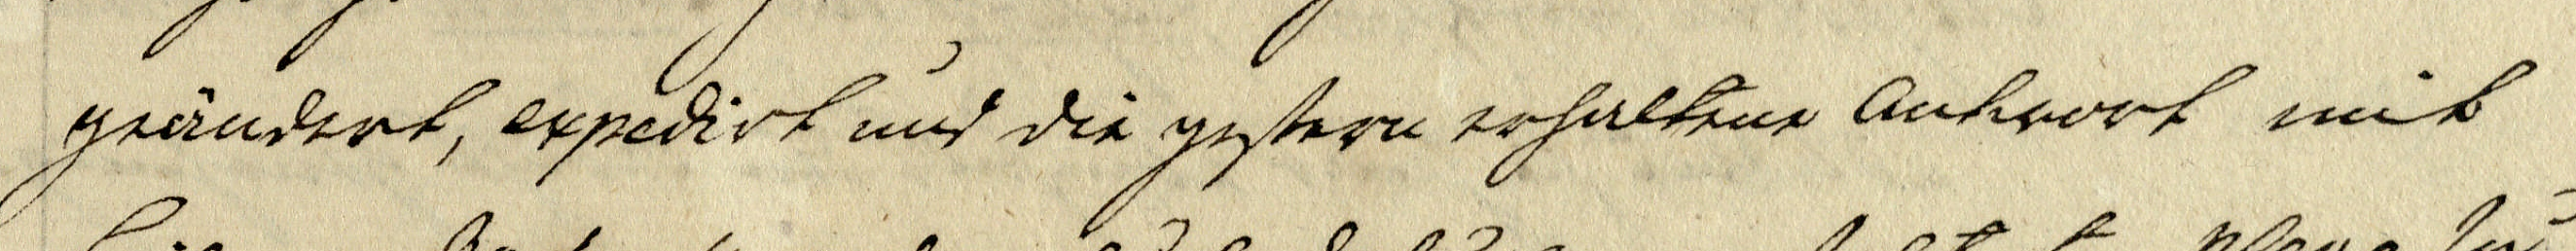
geändert, expedirt und die gestern erhaltene Antwort mit
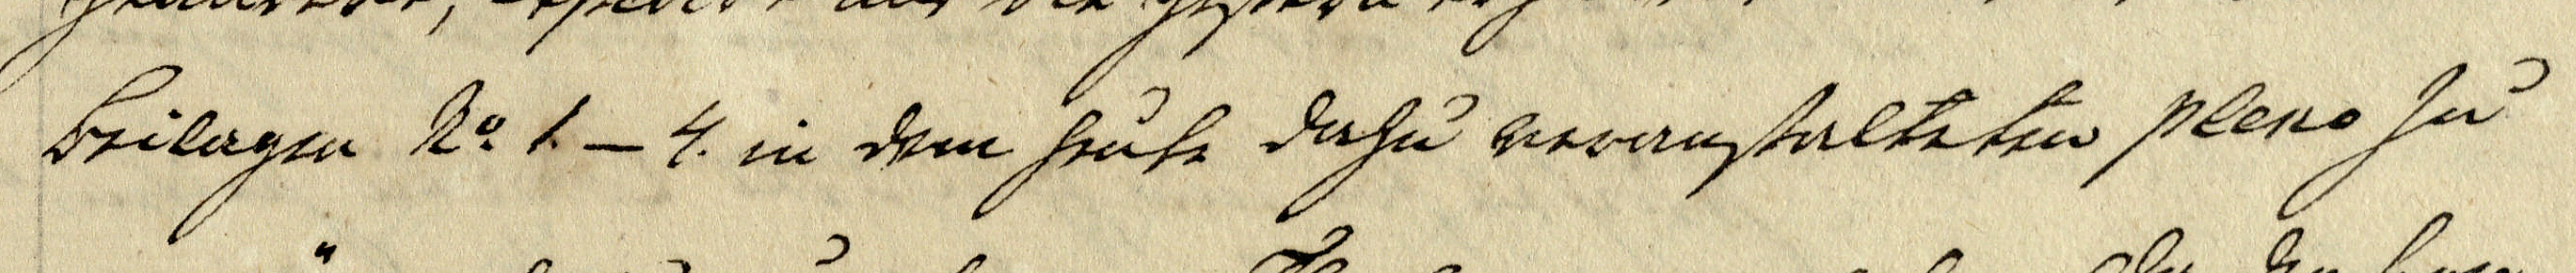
Beilagen No 1-4. in dem heute dazu veranstalteten pleno zu
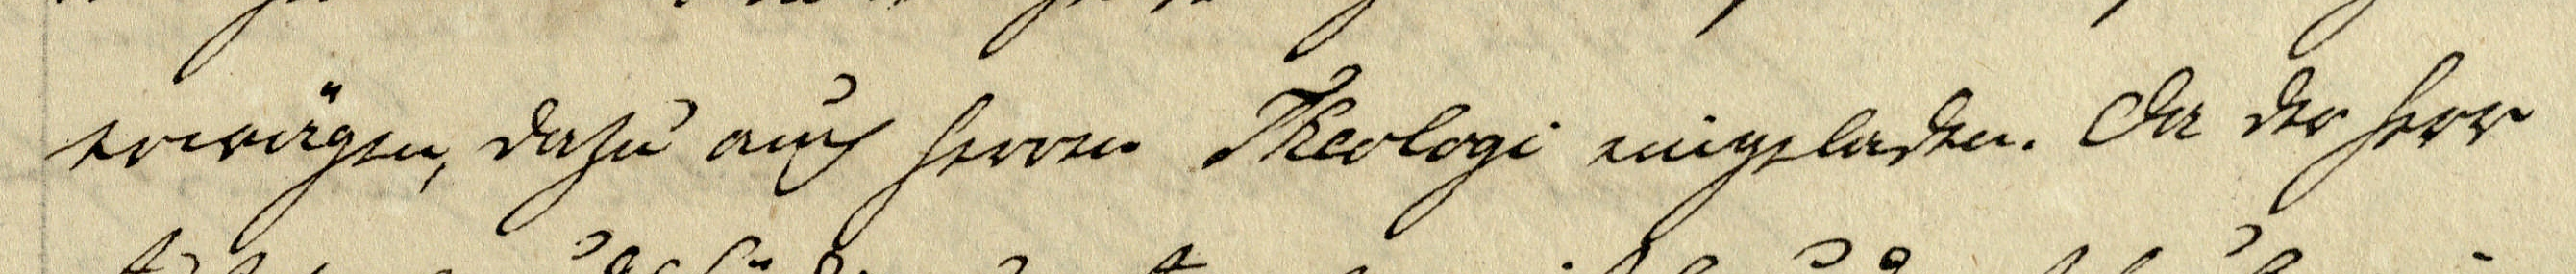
erwägen, dazu auch Herren Theologi eingeladen. Da der Herr
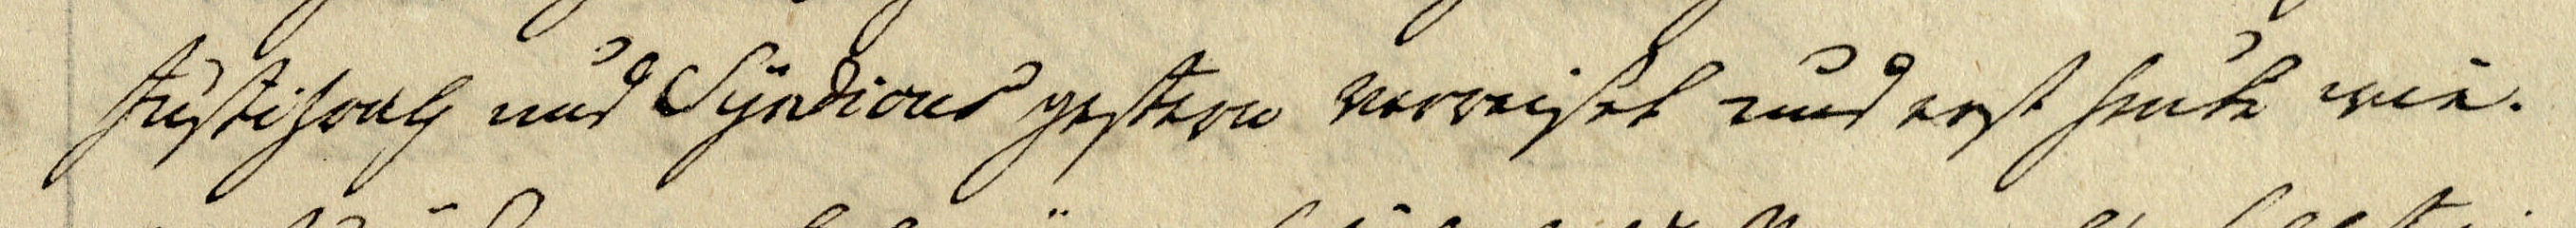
Justizrath und Sÿndicus gestern verreiset und erst heute wie¬
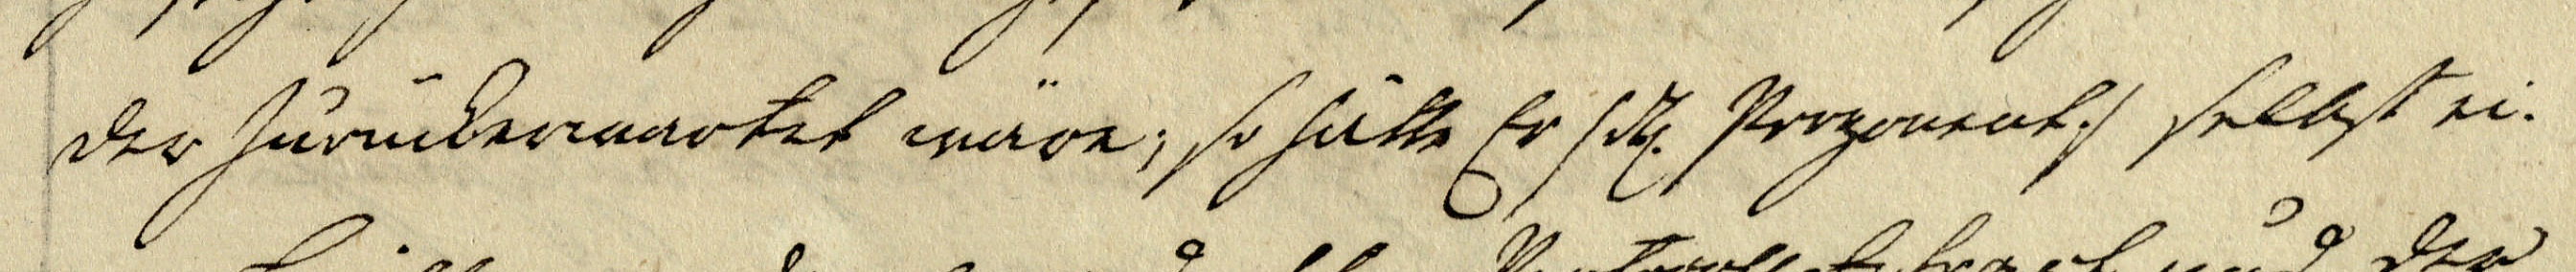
der rurückerwartet wäre, so hätte Er /dh. Proponent/ selbst ei¬
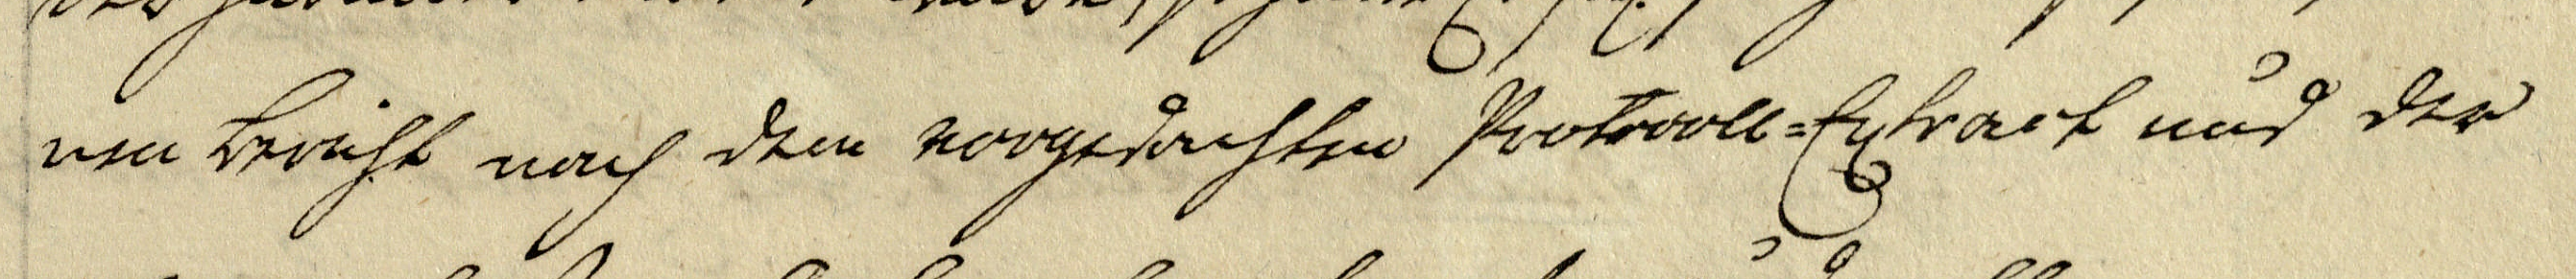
nen Bericht nach dem vorgedachten Protocoll-Extract und der
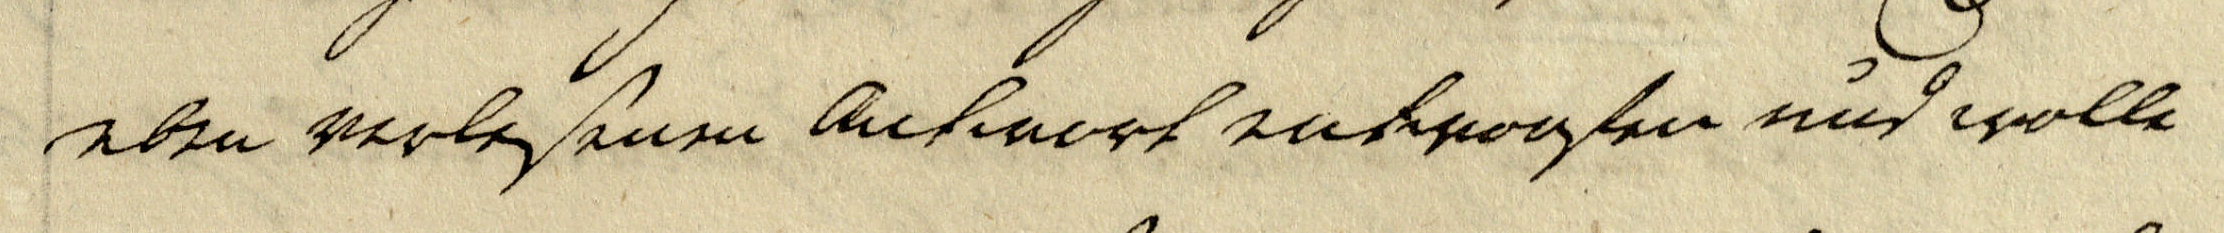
eben verlesenen Antwort entworfen und wolle
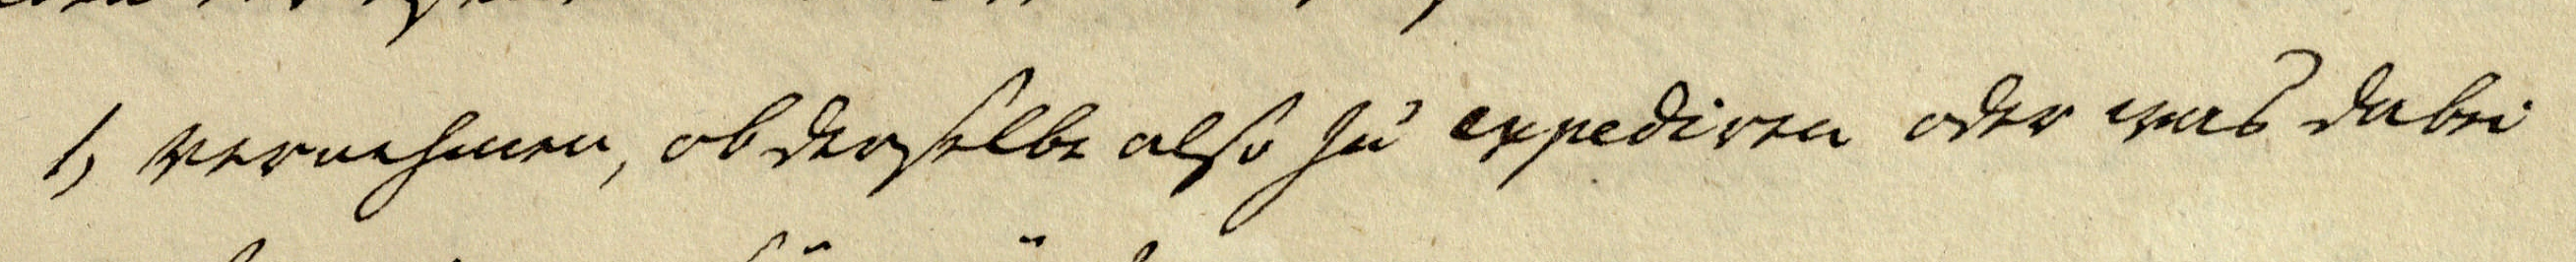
1, vernehmen, ob derselbe also zu expediren oder was dabei
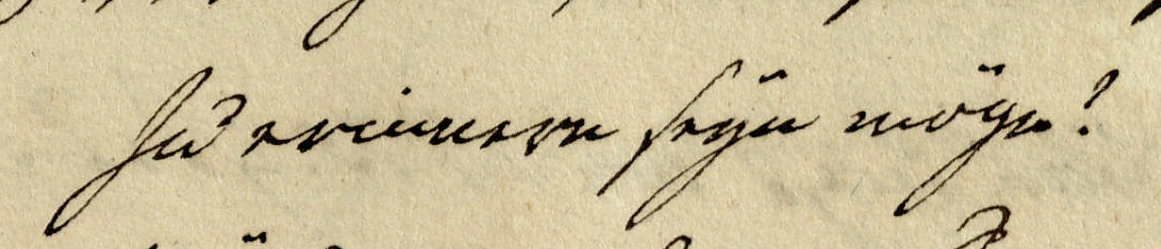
zu erinnern seÿn möge.
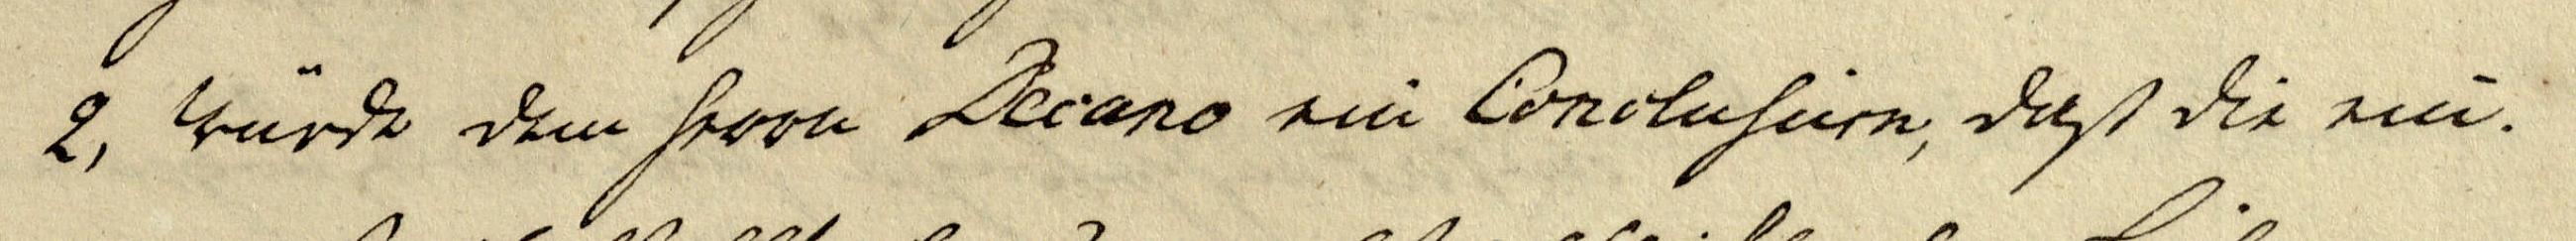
2, Würde dem Herrn Decano ein Conclusum, daß die ein¬
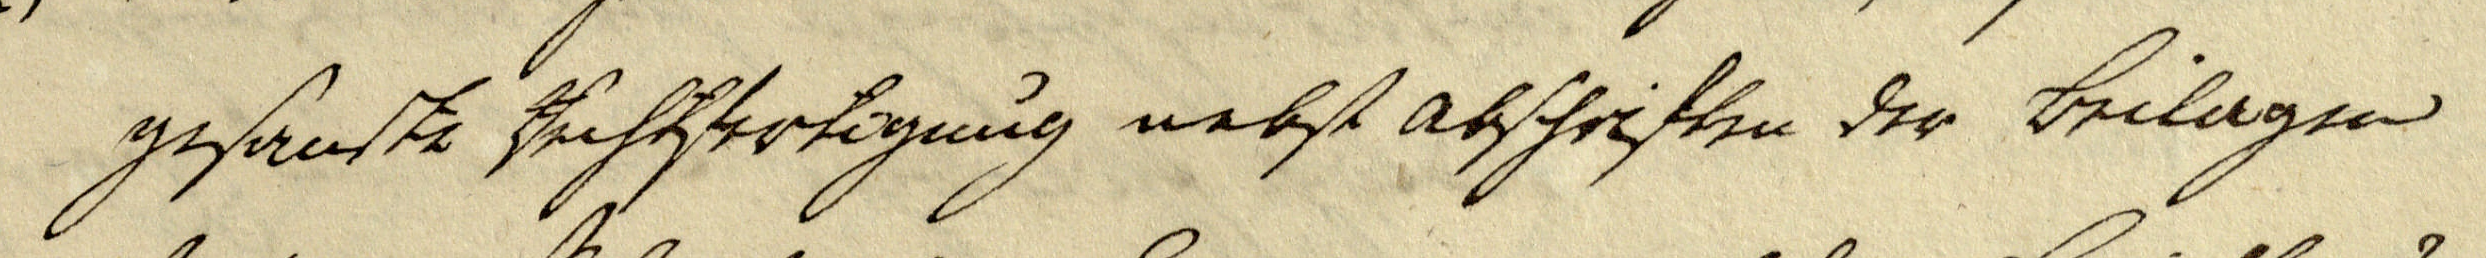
gesandte Rechtfertigung nebst Abschriften der Beilagen
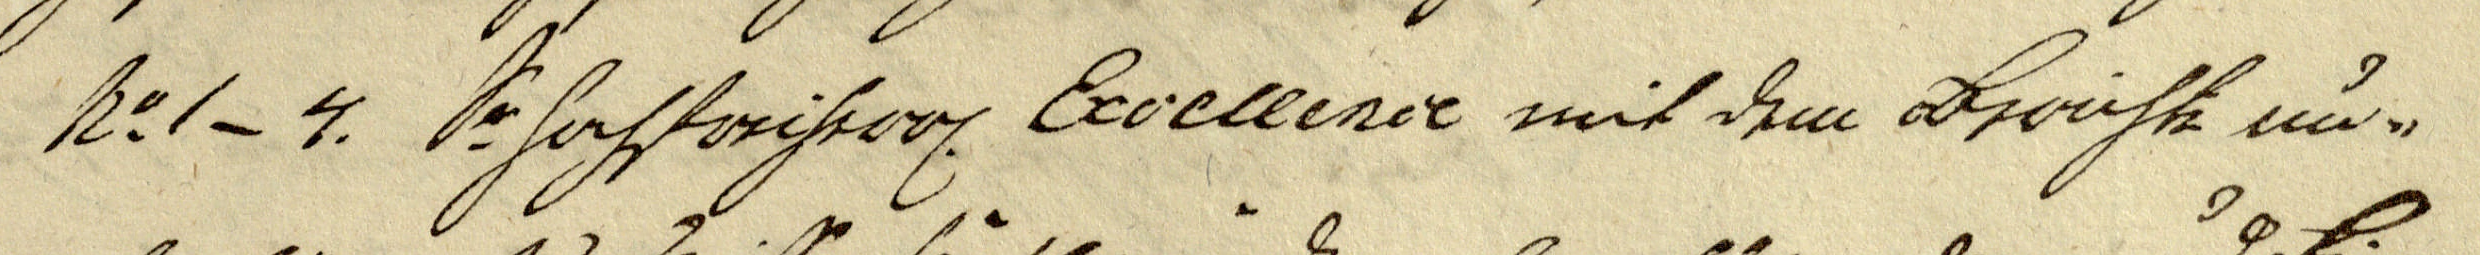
No 1-4. Sr Hochfreiherrl. Excellence mit dem Berichte un¬
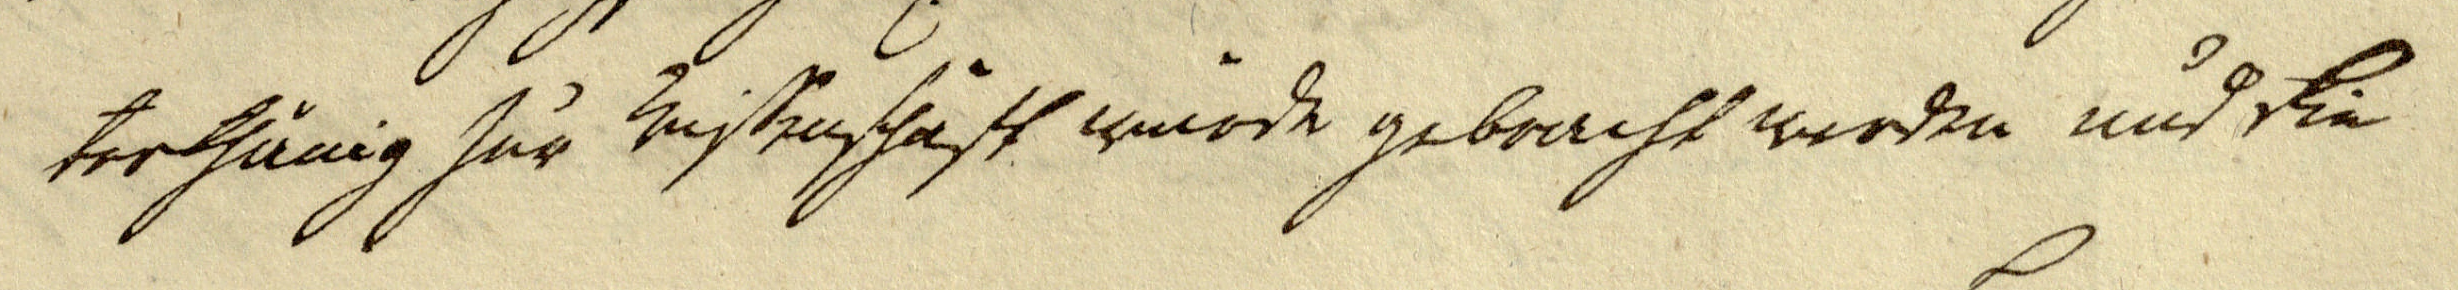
terthänig zur Wissenschaft würde gebracht werden und die
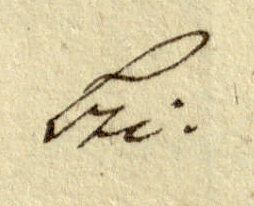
Bei
